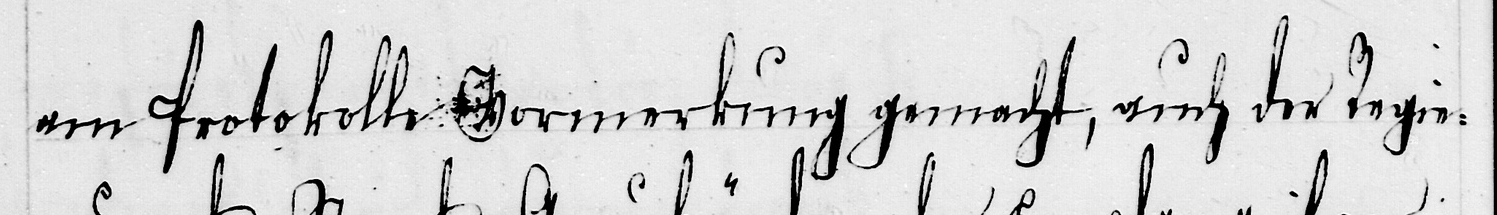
am Protokolle Vormerkung gemacht, auch der Regie¬
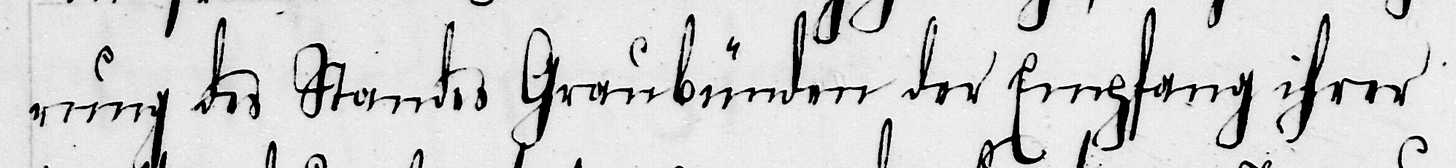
rung des Standes Graubünden der Empfang ihrer
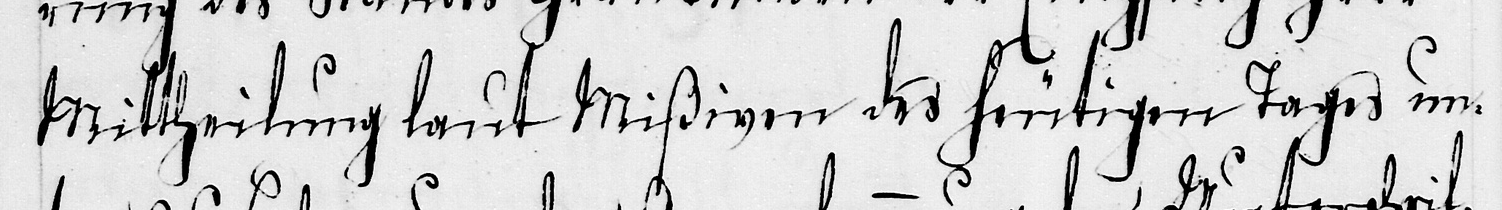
Mittheilung laut Mißiven des heutigen Tages un¬
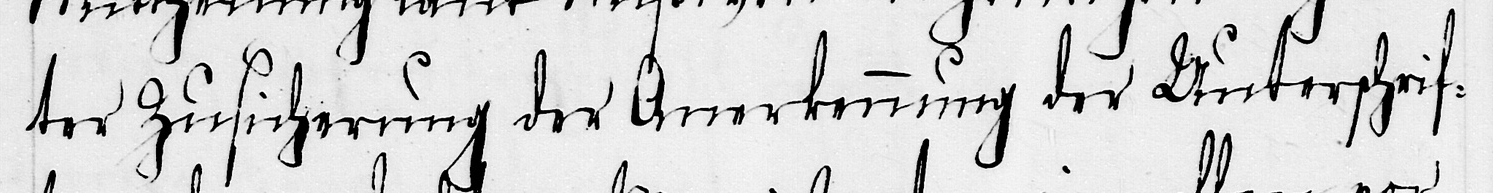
ter Zusicherung der Anerkennung der Unterschrif¬
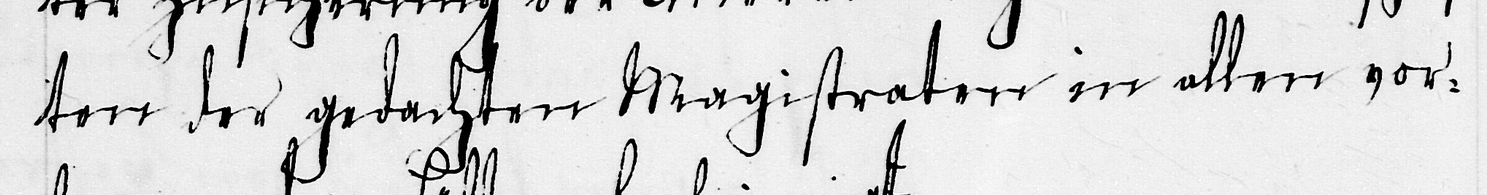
ten der gedachten Magistraten in allen vor¬
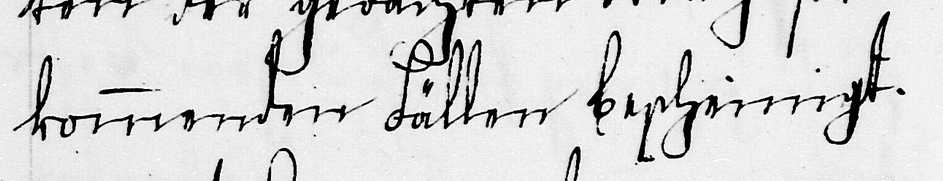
kommenden Fällen bescheinigt.
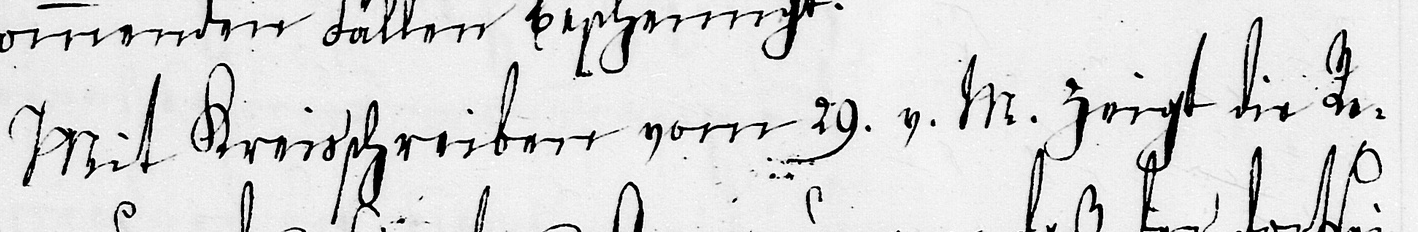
Mit Kreisschreiben vom 29. v. M. zeigt die Re¬
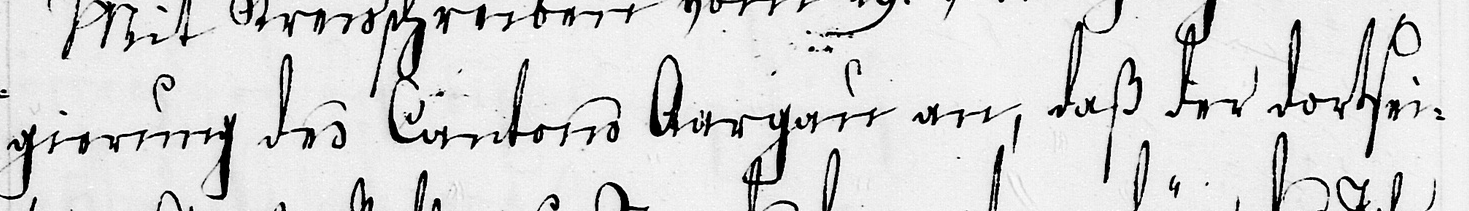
gierung des Cantons Aargau an, daß der dortsei¬
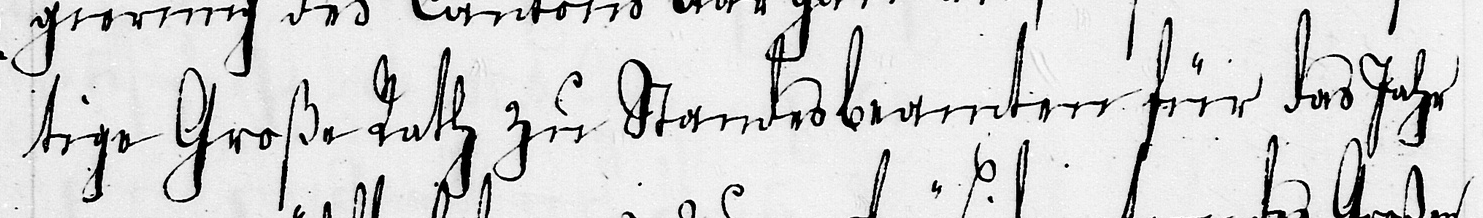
tige Große Rath zu Standesbeamten für das Jahr
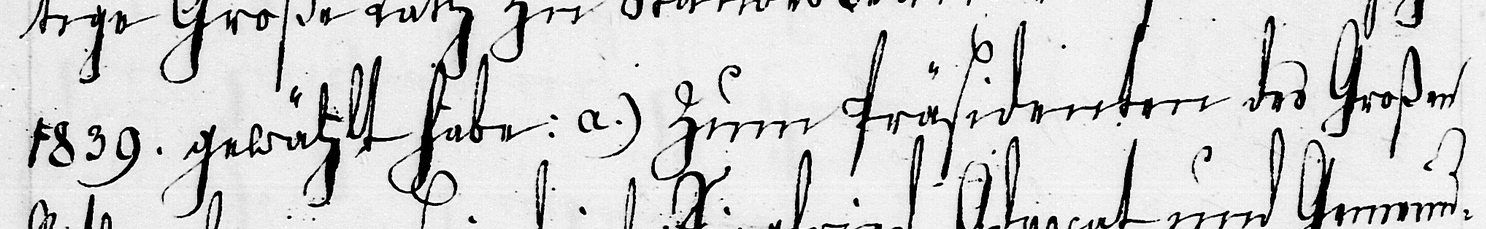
1839 gewählt habe: a.) Zum Präsidenten des Großen
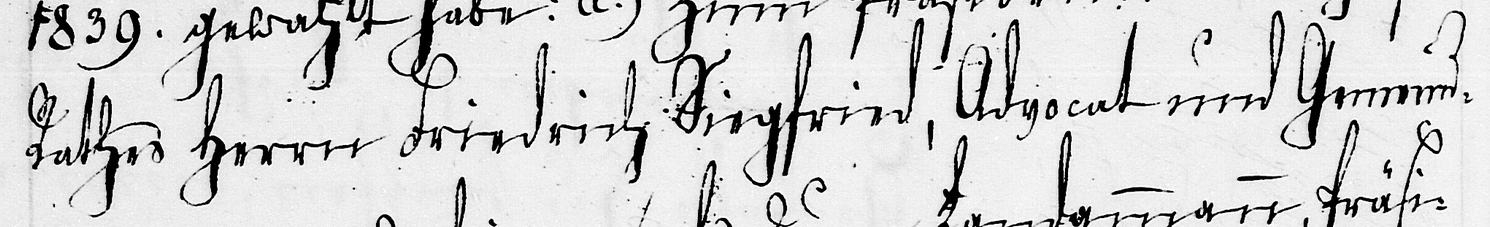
Rathes Herrn Friedrich Siegfried, Advocat und Gemein¬
